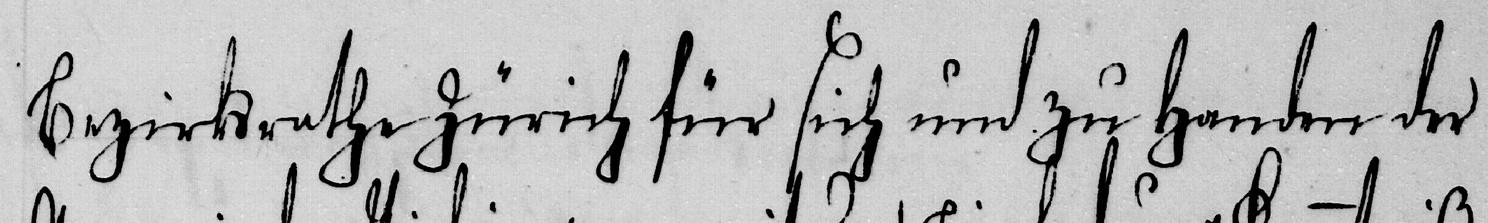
Bezirksrathe Zürich für sich und zu Handen der
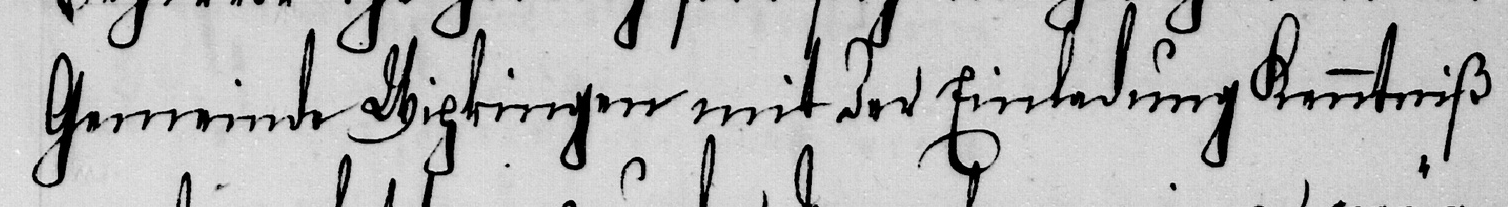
Gemeinde Wipkingen mit der Einladung Kenntniß
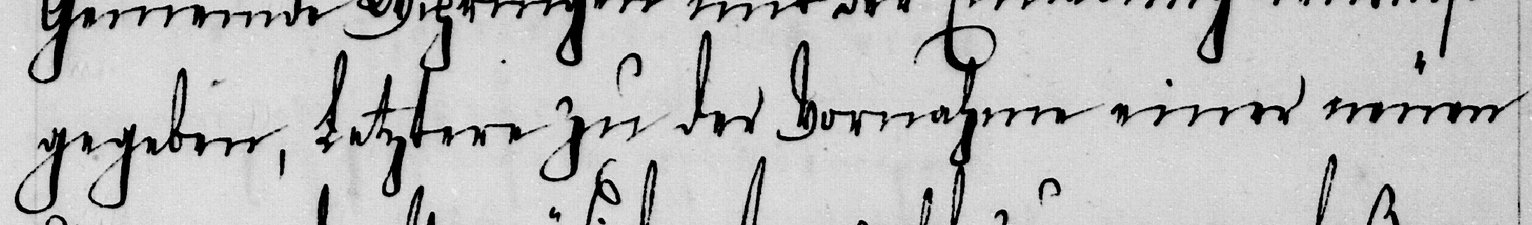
gegeben, Letztere zu der Vornahme einer neuen
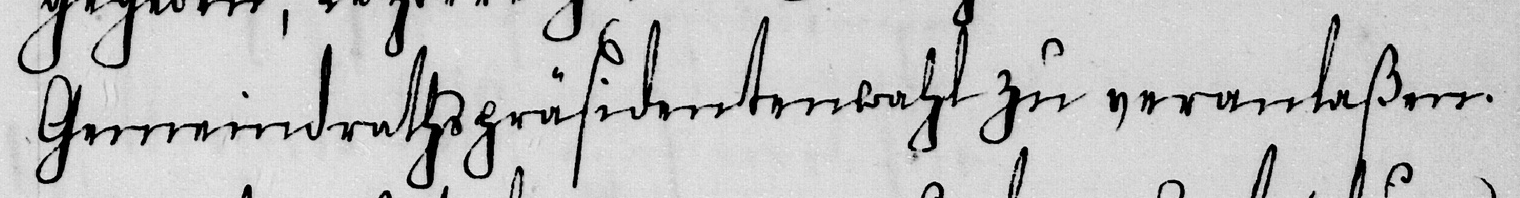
Gemeindrathspräsidentenwahl zu veranlaßen.
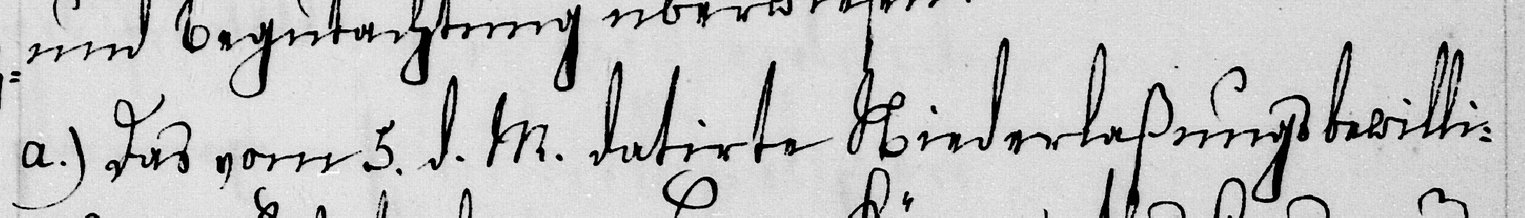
a.) Das vom 5. d. M. datirte Niederlaßungsbewilli¬
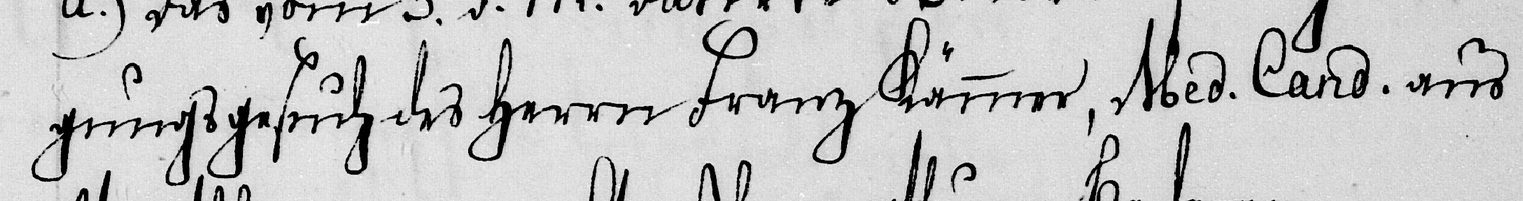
gungsgesuch des Herrn Franz Kämmer, Med. Cand. aus
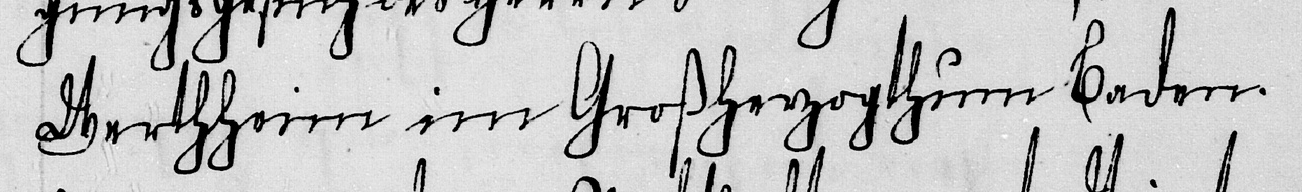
Werthheim im Großherzogthum Baden.
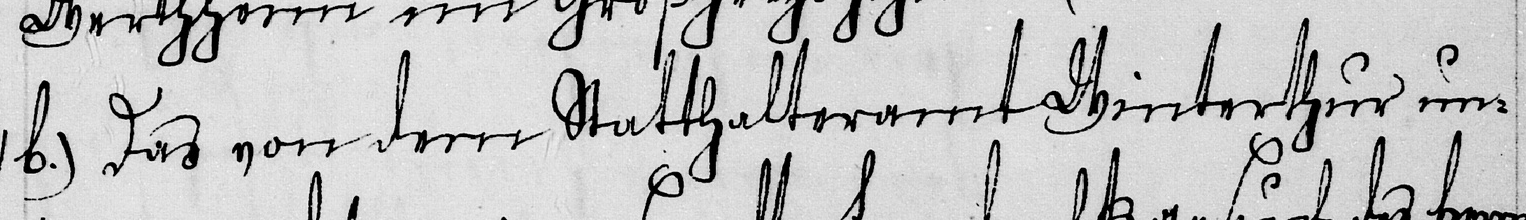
b.) Das von dem Statthalteramt Winterthur un¬
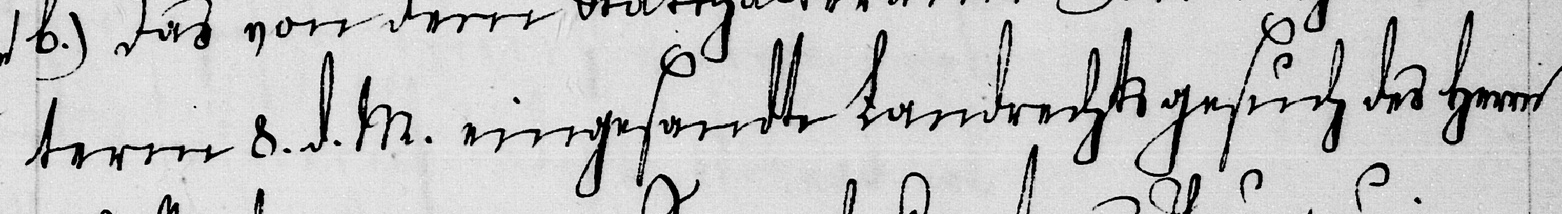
term 8. d. M. eingesandte Landrechtsgesuch des Her¬
